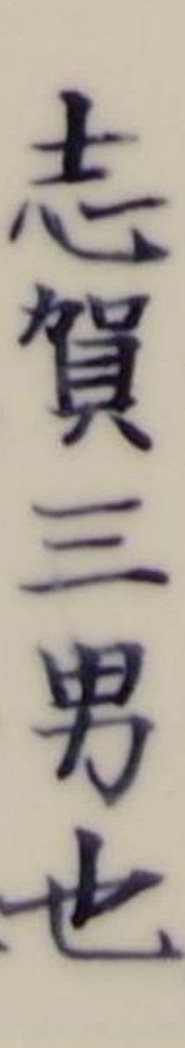志賀三男也
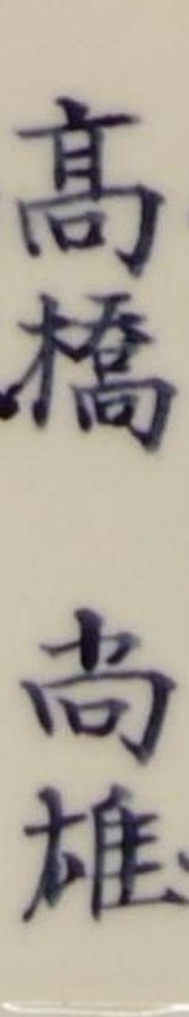高橋尚雄
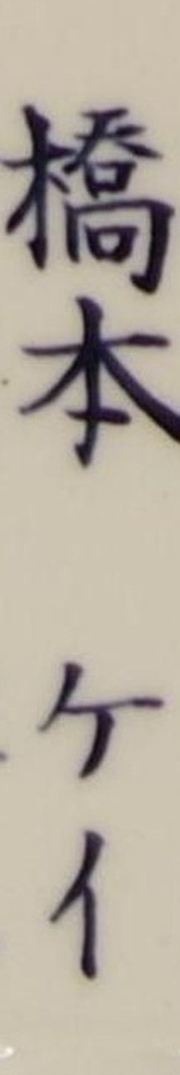橋本ケイ
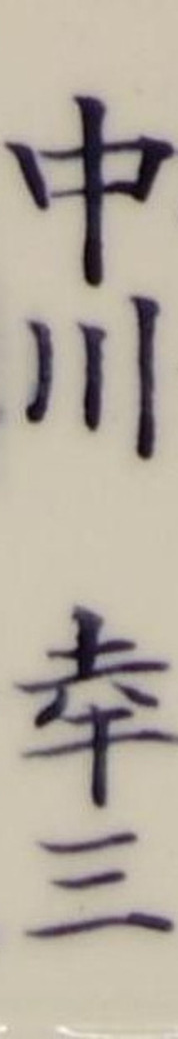中川幸三
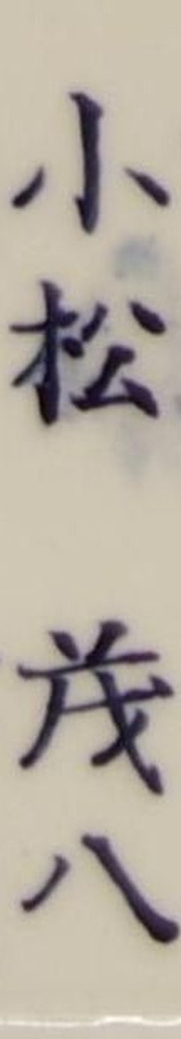小松茂八
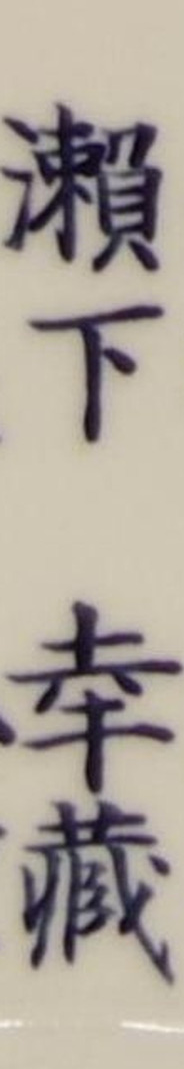瀬下幸蔵
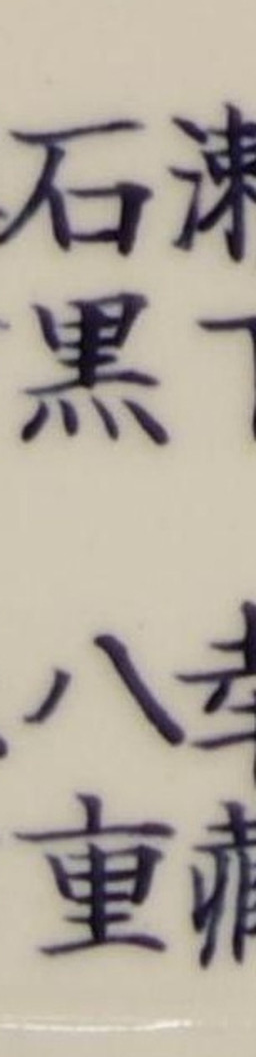石黒八重

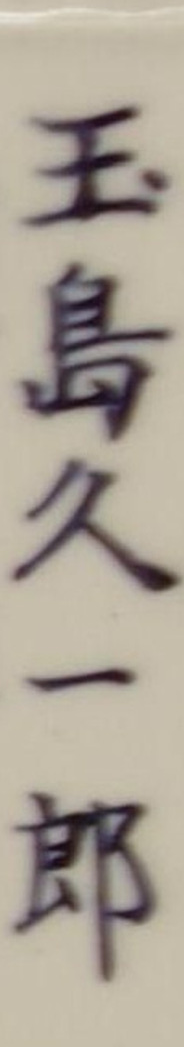玉島久一郎
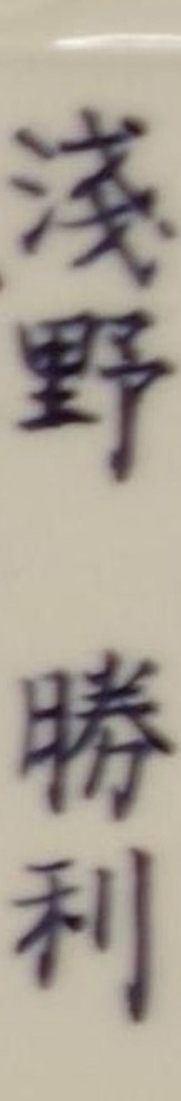浅野勝利
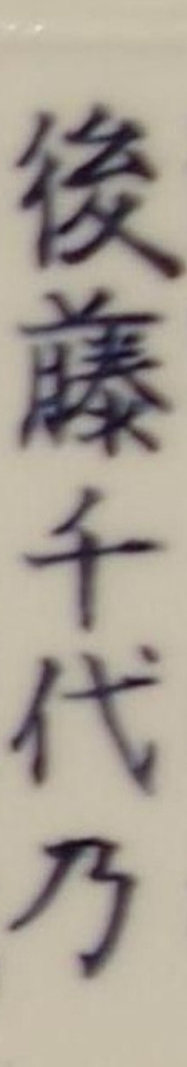後藤千代乃
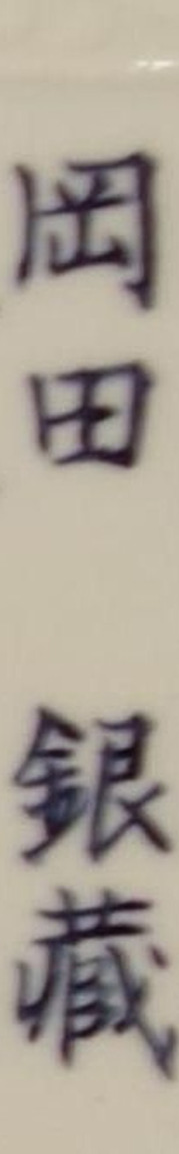岡田銀蔵
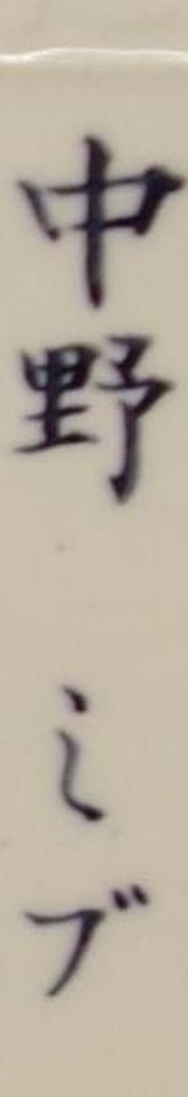中野ミブ
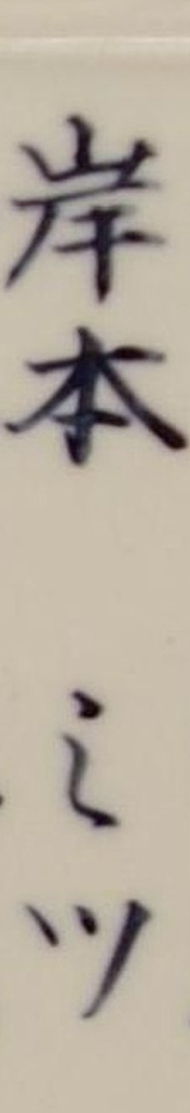岸本ミツ
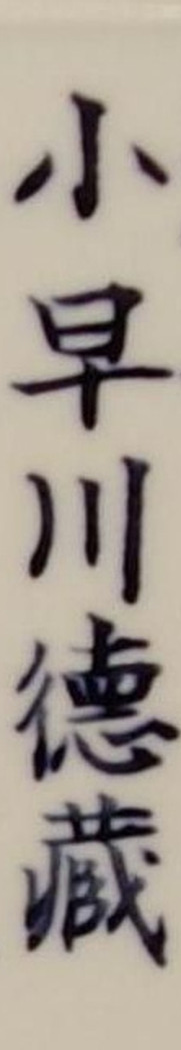小早川徳蔵
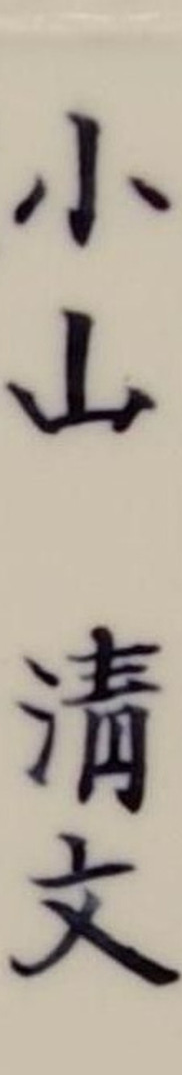小山清文
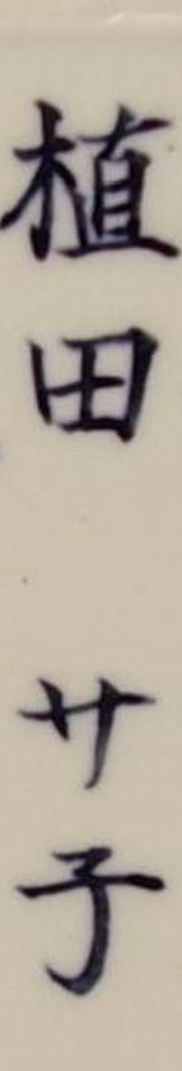植田サ子
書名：E~L
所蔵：高野山金剛峯寺
